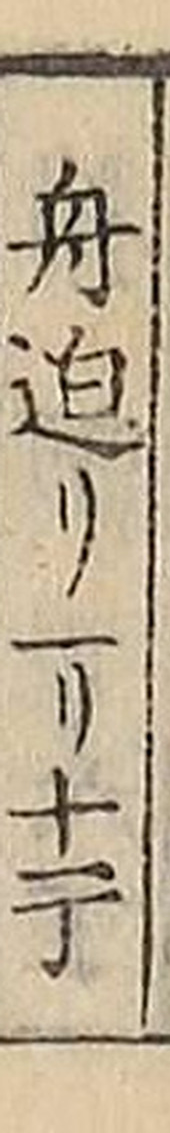舟迫リ一リ十一丁
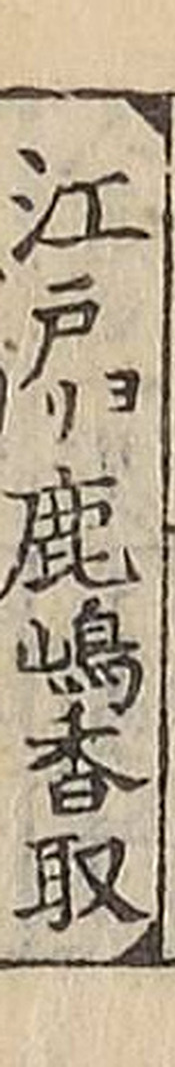江戸ヨリ鹿島香取
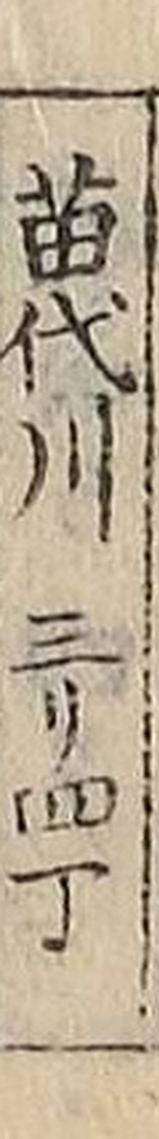苗代川三リ四丁
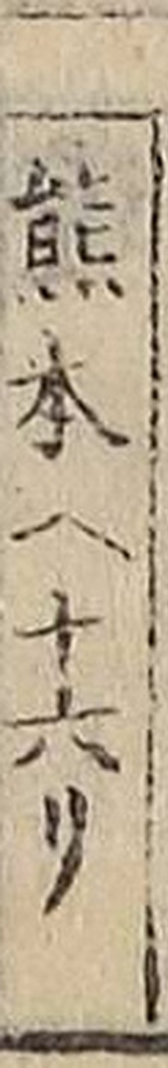熊本へ十六リ
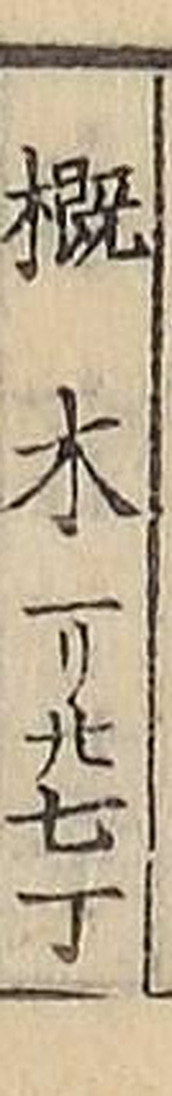概木一リ廿七丁
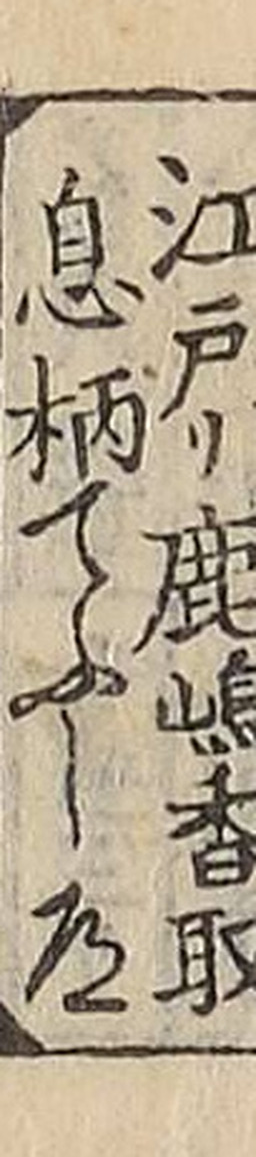息柄てふし道
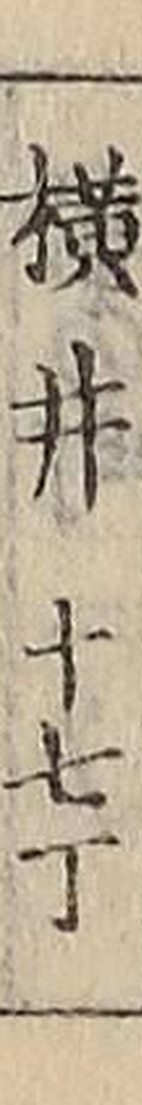横井十七丁
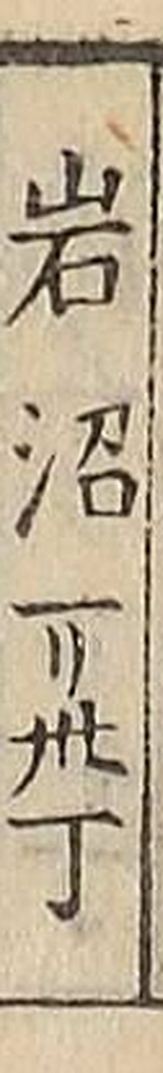岩沼一リ卅丁
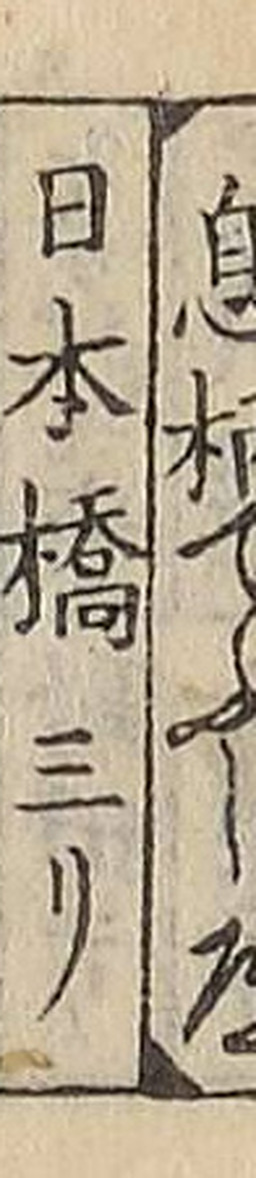日本橋三リ
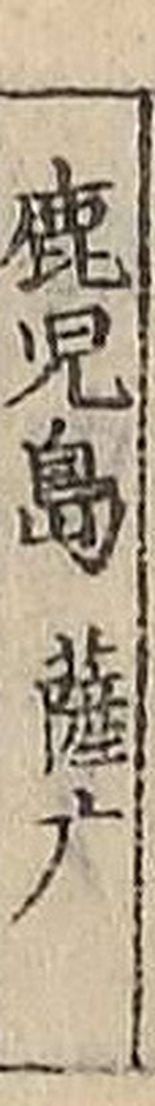鹿児島薩摩
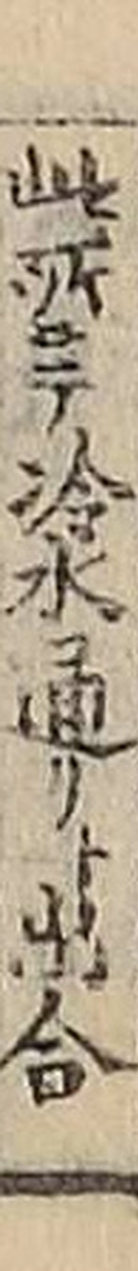此所ニテ冷水通リト出合
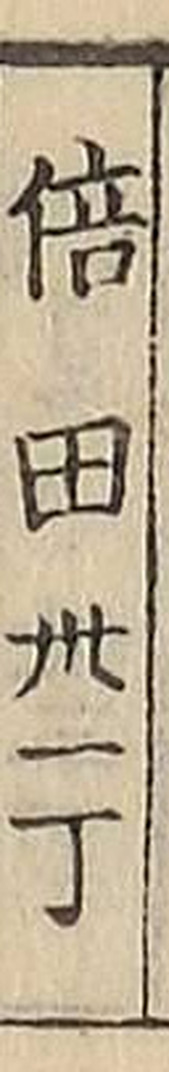倍田卅一丁
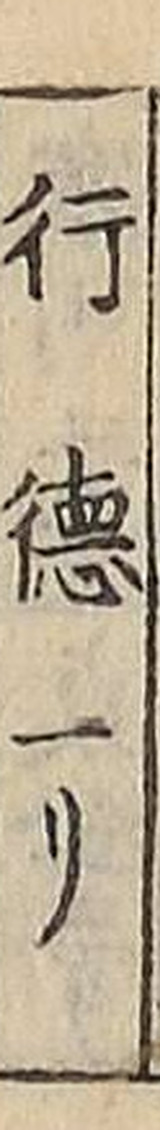行徳一リ
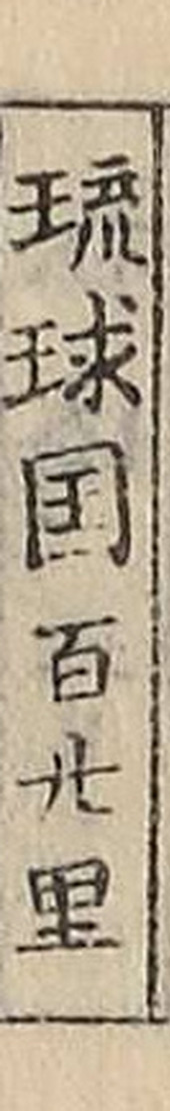琉球国百廿里
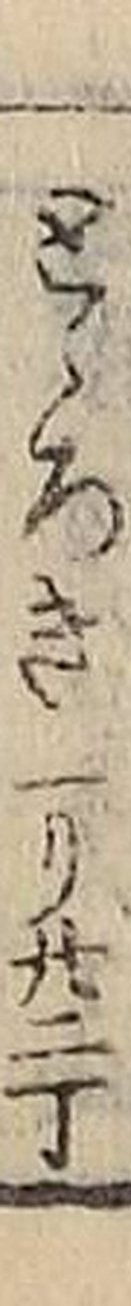とゝろき一リ廿二丁
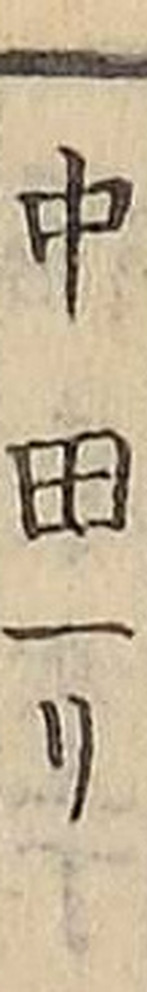中田一リ
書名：旅行用心集
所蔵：神戸大学附属図書館 国文学研究資料館
